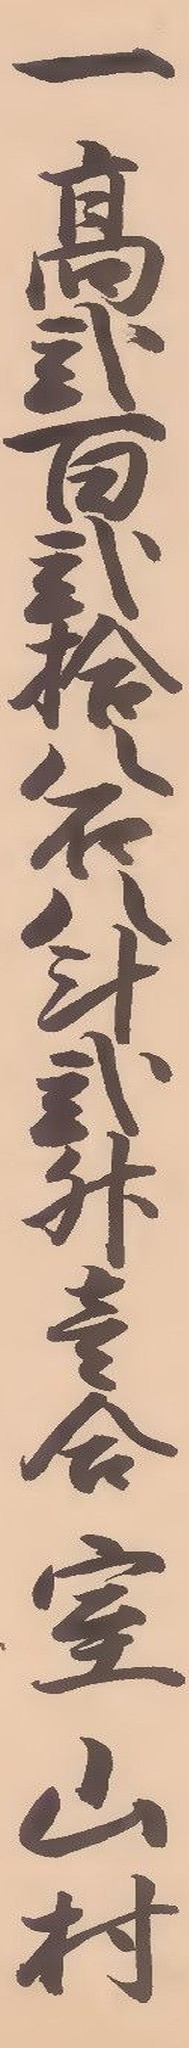一高弐百弐拾八石八斗弐升壱合室山村
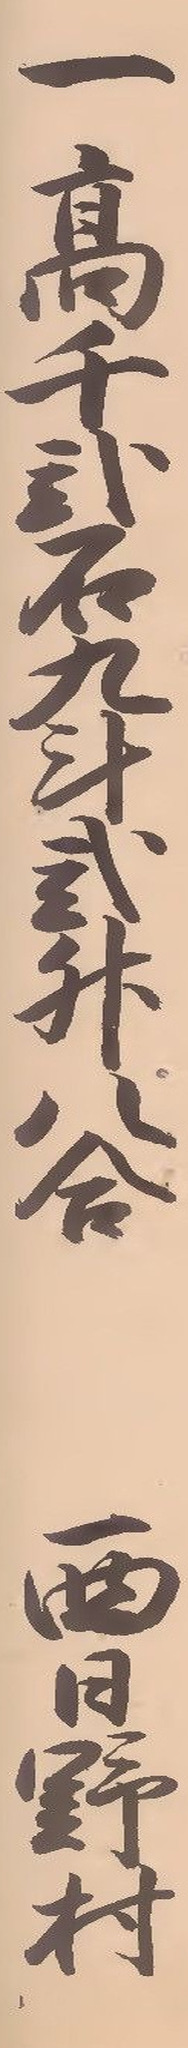一高千弐石九斗弐升八合西日野村
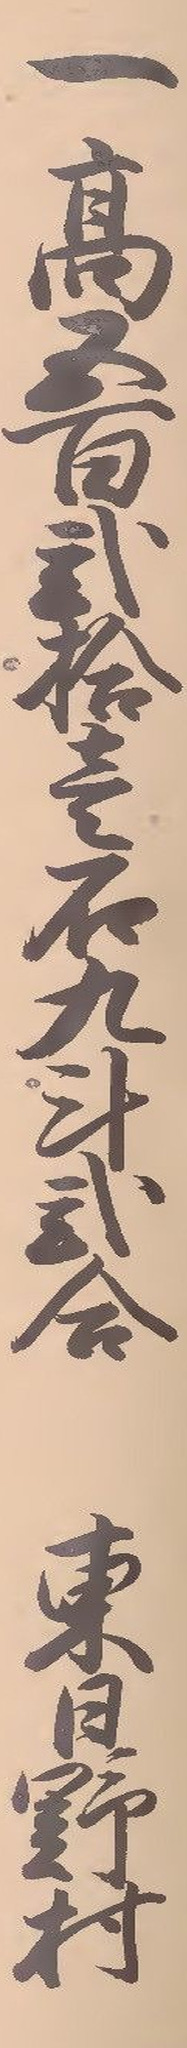一高五百弐拾壱石九斗弐合東日野村
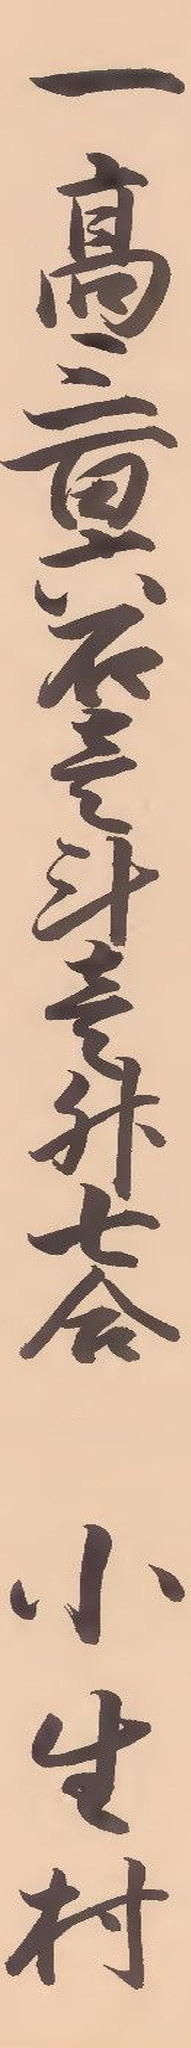一高三百六石壱斗壱升七合小生村
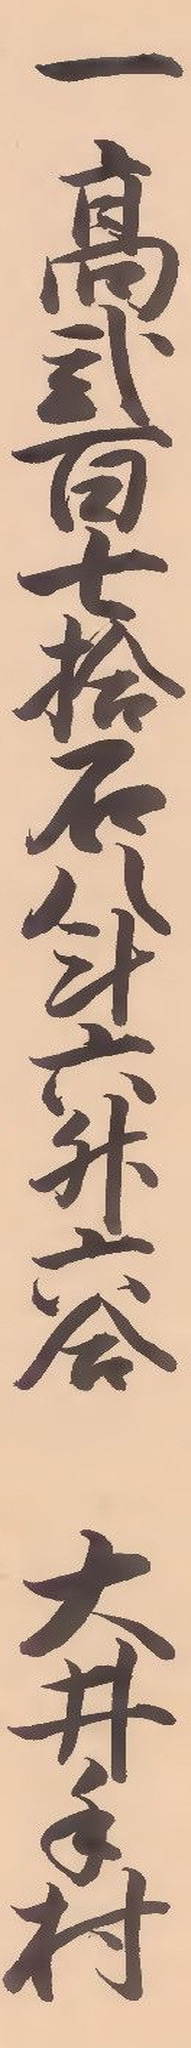一高弐百七拾石八斗六升六合大井手村
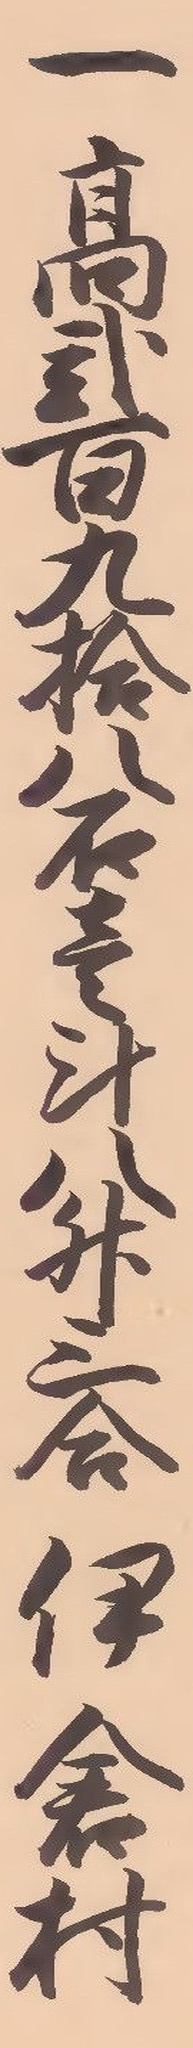一高弐百九拾八石壱斗八升三合伊倉村

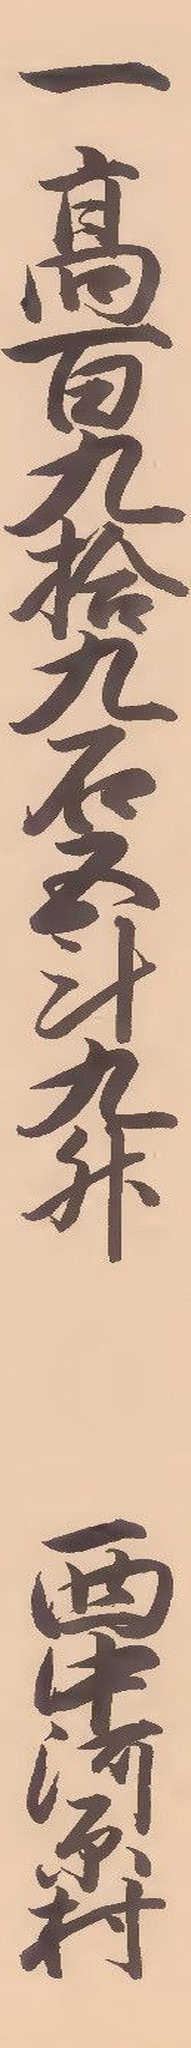一高百九拾九石五斗九升西中河原村
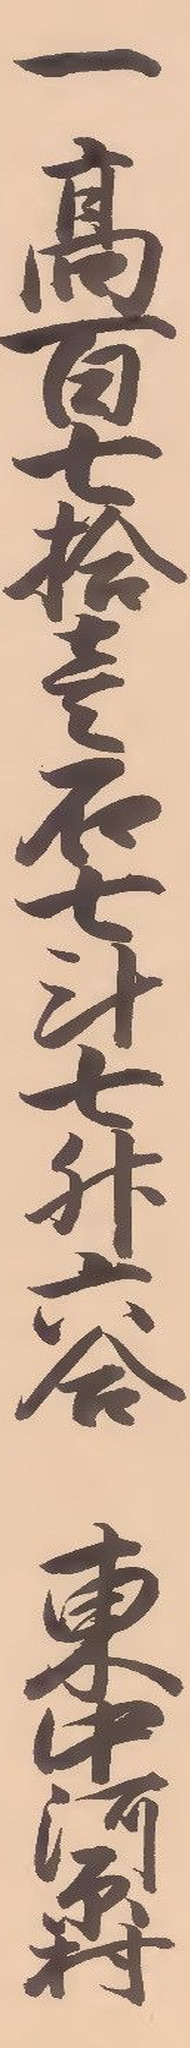一高百七拾壱石七斗七升六合東中河原村
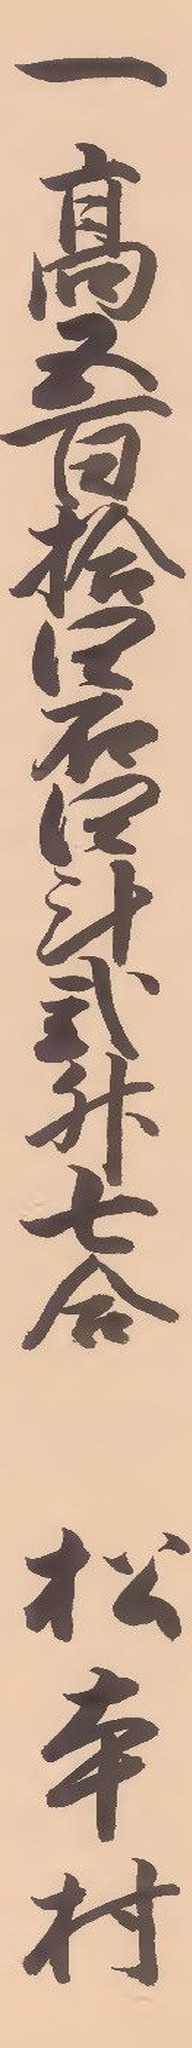一高五百拾四石四斗弐升七合松本村
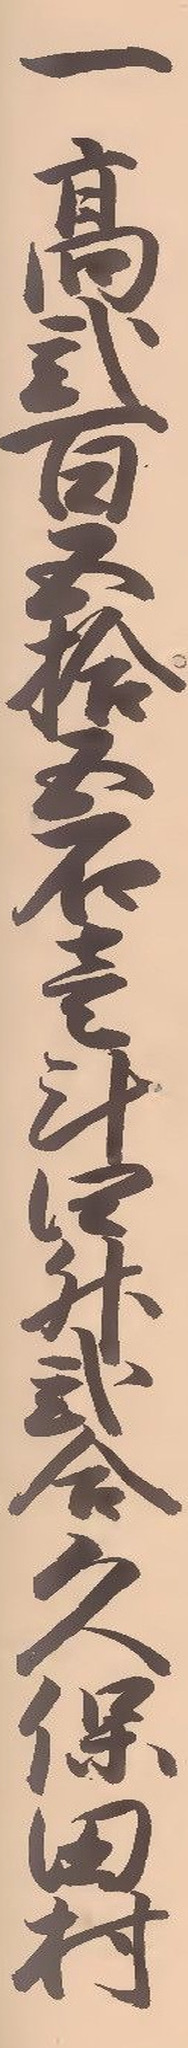一高弐百五拾五石壱斗四升弐合久保田村
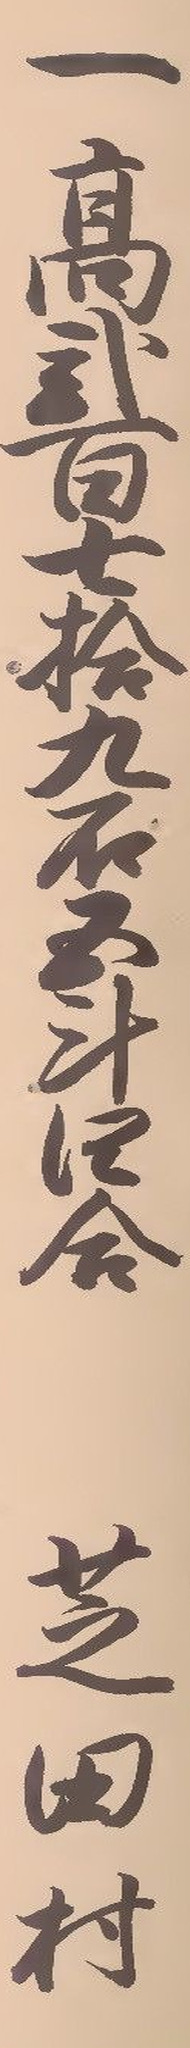一高弐百七拾九石五斗四合芝田村
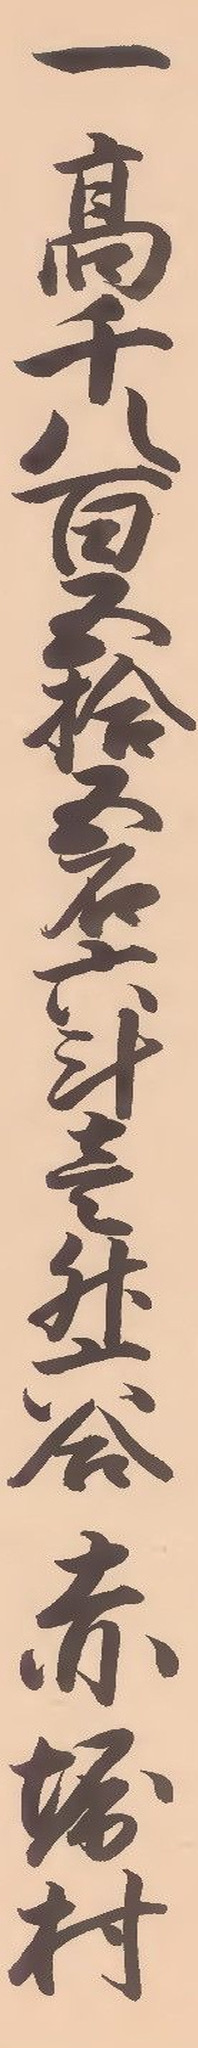一高千八百五拾五石六斗壱升六合赤堀村
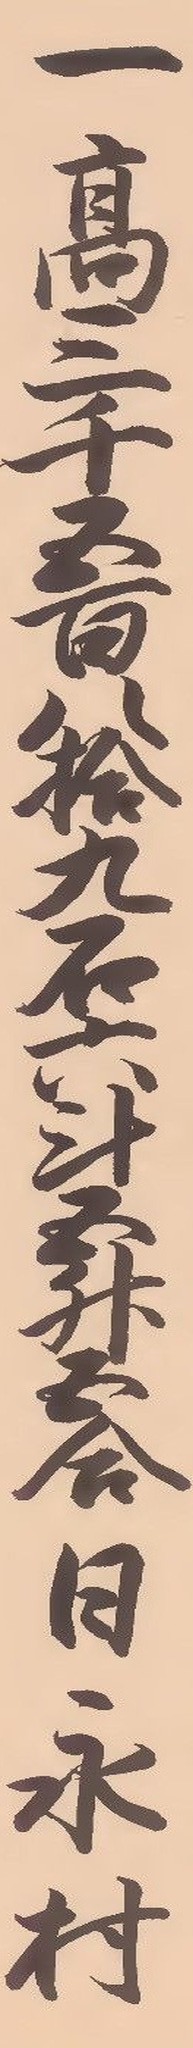一高三千五百八拾九石六斗五升五合日永村
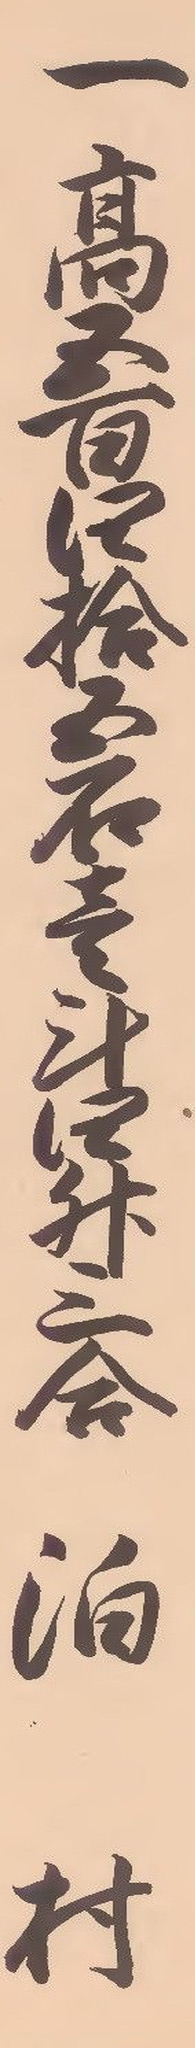一高五百四拾五石壱斗四升三合泊村

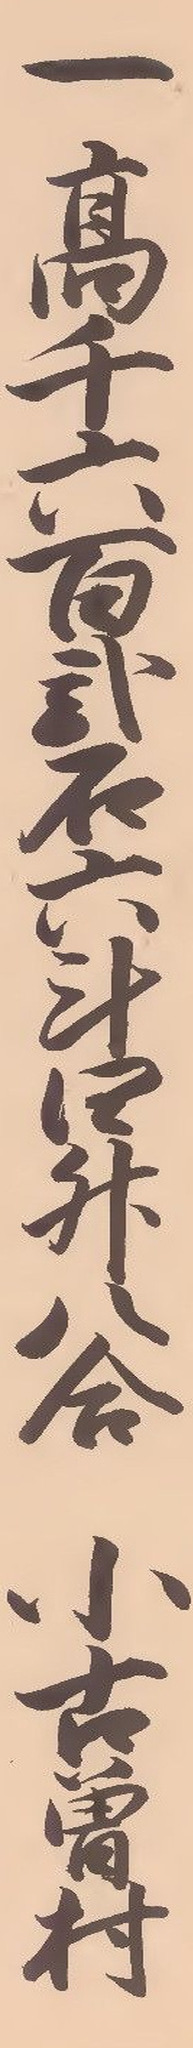一高千六百弐石六斗四升八合小古曽村
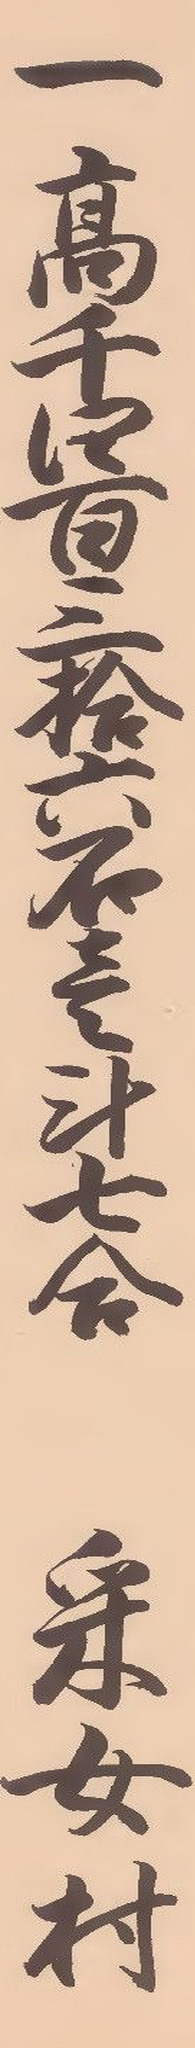一高千四百三拾六石壱斗七合采女村
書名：伊勢国郷帳
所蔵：国立公文書館 National Archives of Japan
